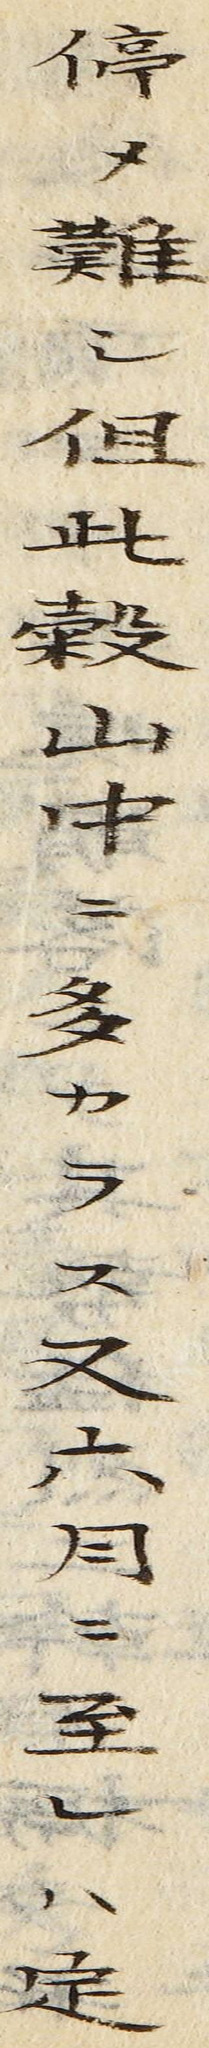停メ難シ但此穀山中ニ多カラス又六月ニ至レハ定
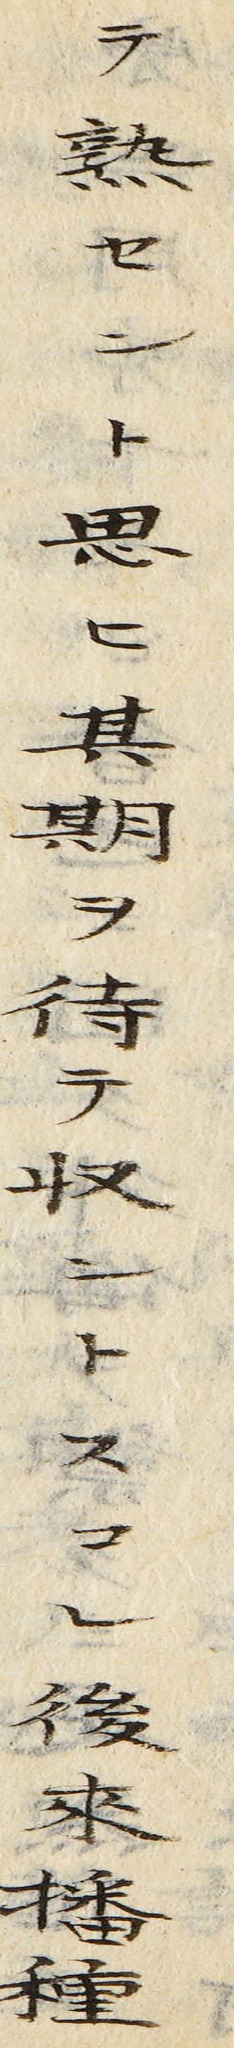テ熟セント思ヒ其期ヲ待テ収ントスコレ後来播種
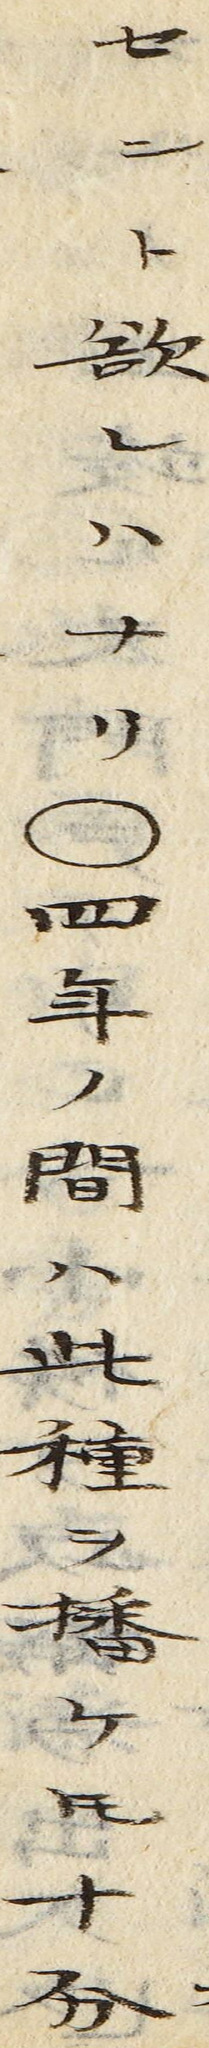セント欲レハナリ◯四年ノ間ハ此種ヲ播ケトモ十分
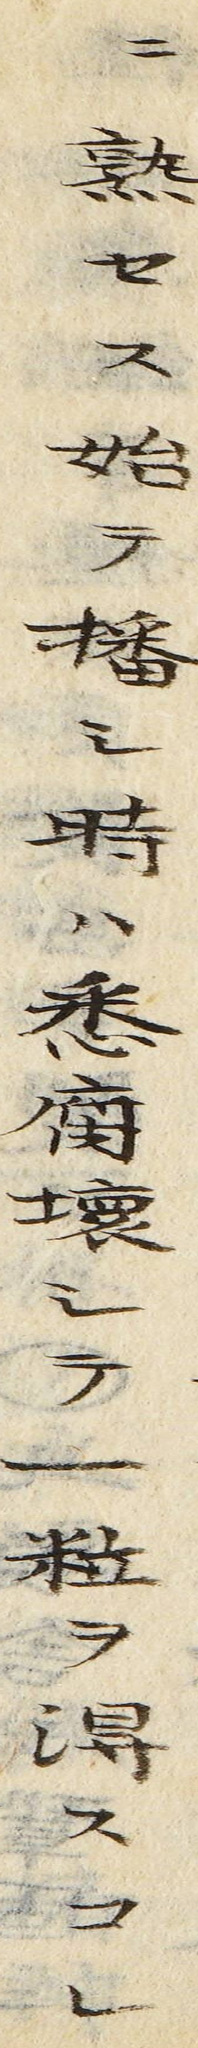ニ熟セス始テ播シ時ハ悉腐壊シテ一粒ヲ得スコレ
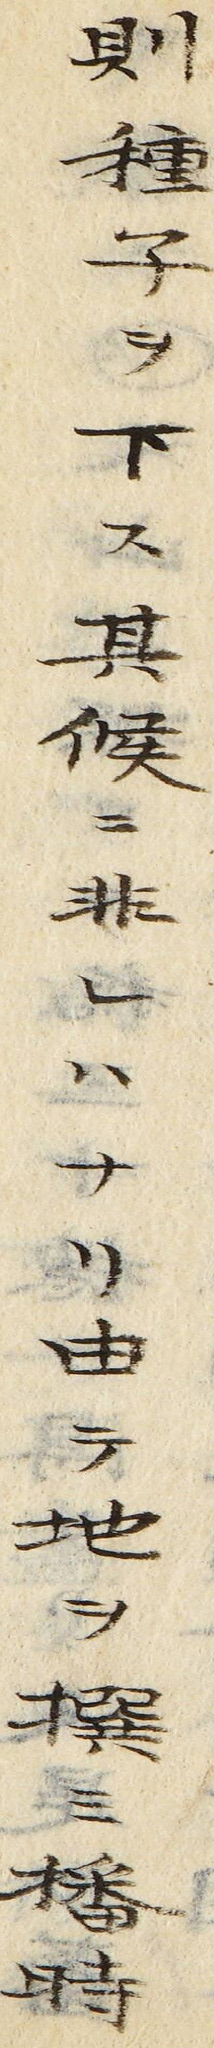則種子ヲ下ス其候ニ非レハナリ由テ地ヲ撰ミ播時

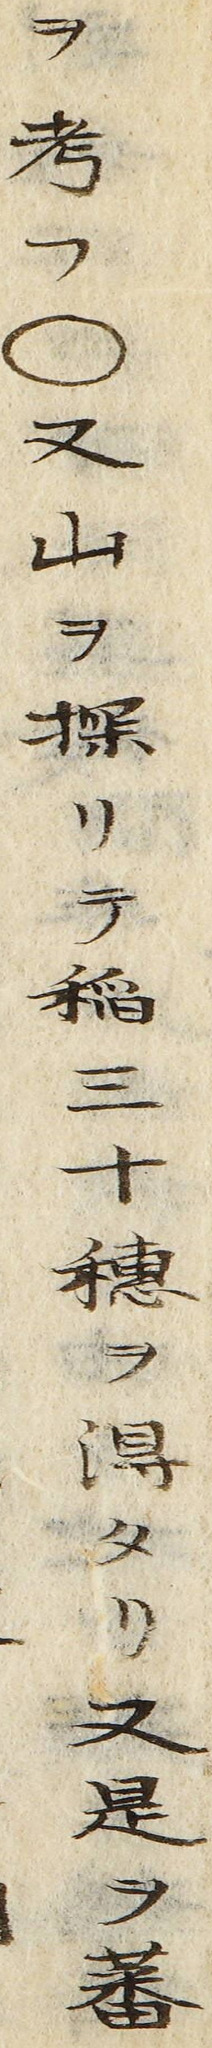ヲ考フ◯又山ヲ探リテ稲三十穂ヲ得タリ又是ヲ蕃
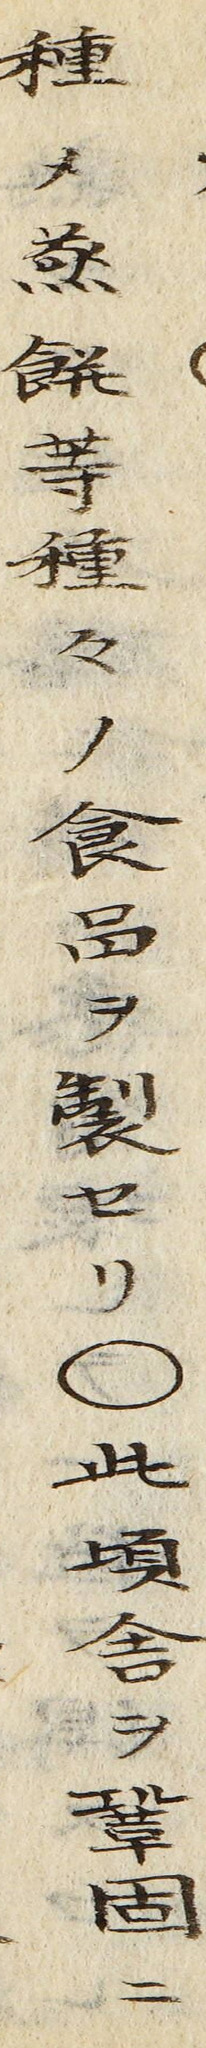種シテ蒸餅等種々ノ食品ヲ製セリ◯此頃舎ヲ鞏固ニ
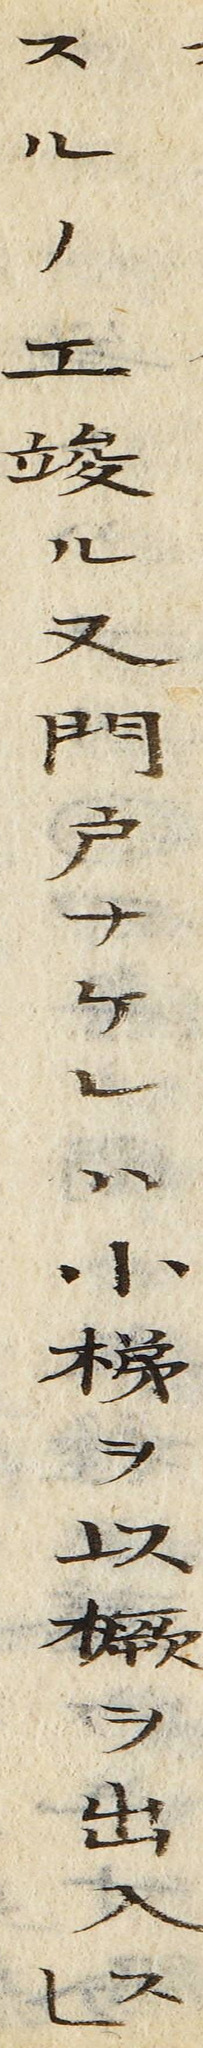スルノ工竣ル又門戸ナケレハ小梯ヲ以橛ヲ出入ス」
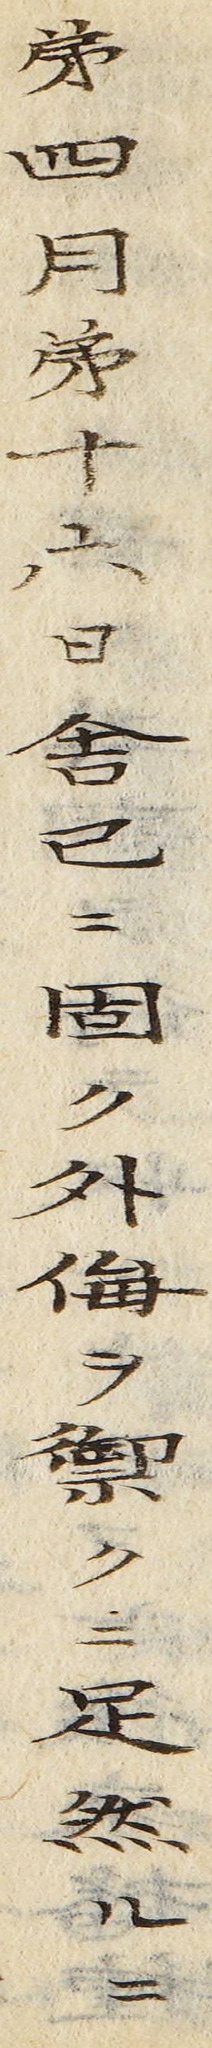第四月第十六日舎已ニ固ク外侮ヲ禦クニ足然ルニ
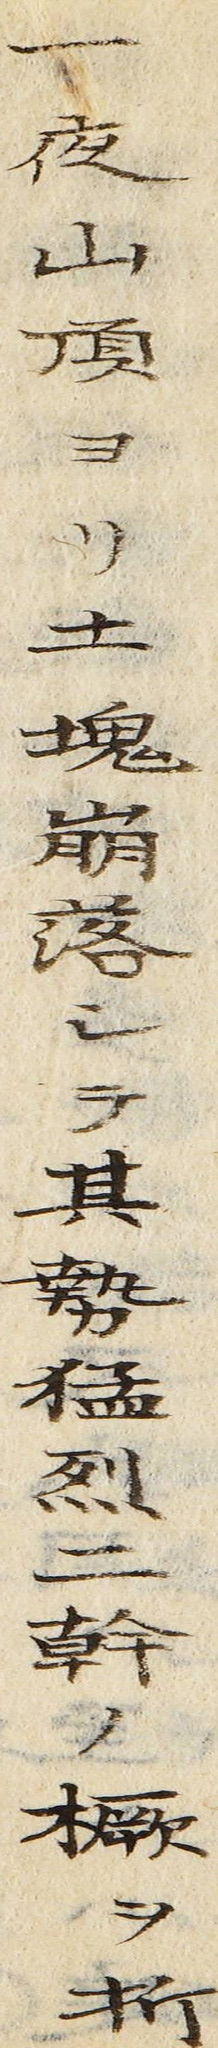一夜山頂ヨリ土塊崩落シテ其勢猛烈二幹ノ橛ヲ折
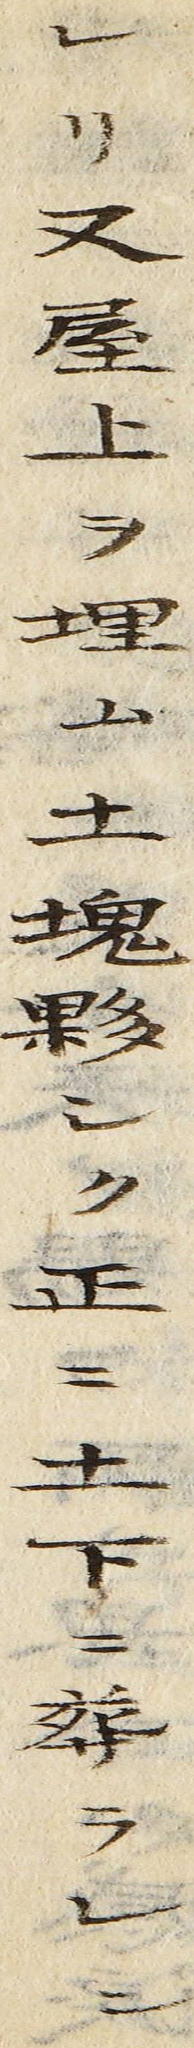レリ又屋上ヲ埋ム土塊夥シク正ニ土下ニ葬ラレン
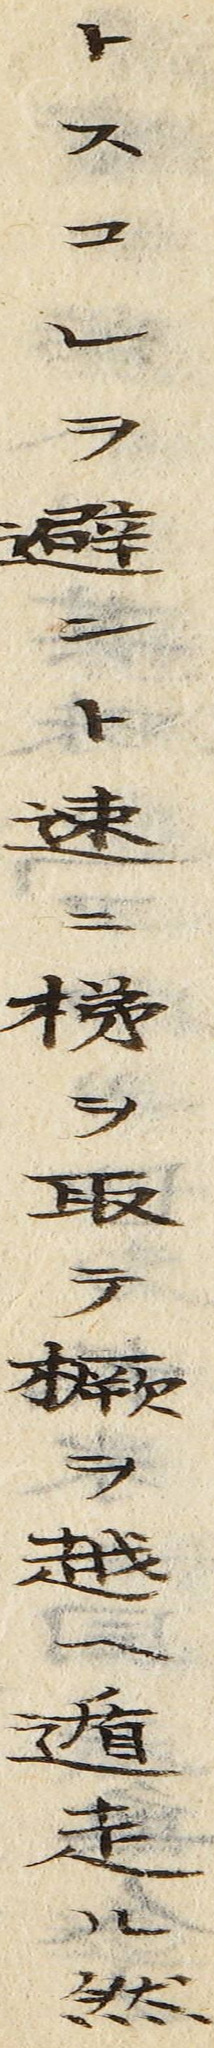トスコレヲ避ント速ニ梯ヲ取テ橛ヲ越ヘ遁走ル然
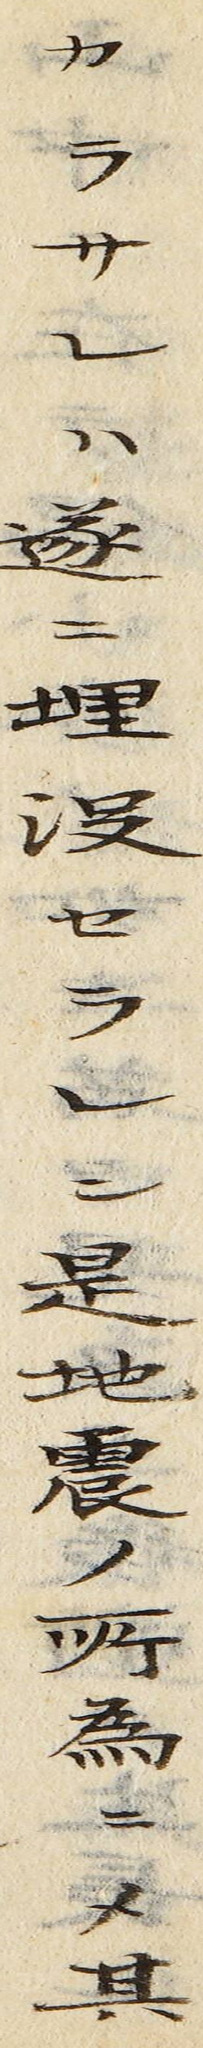カラサレハ遂ニ埋没セラレン是地震ノ所為ニシテ其
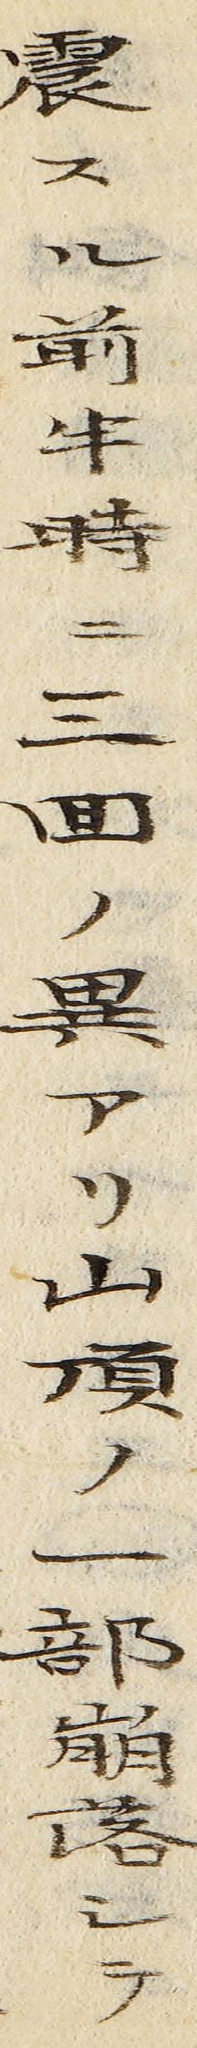震スル前半時ニ三回ノ異アリ山頂ノ一部崩落シテ
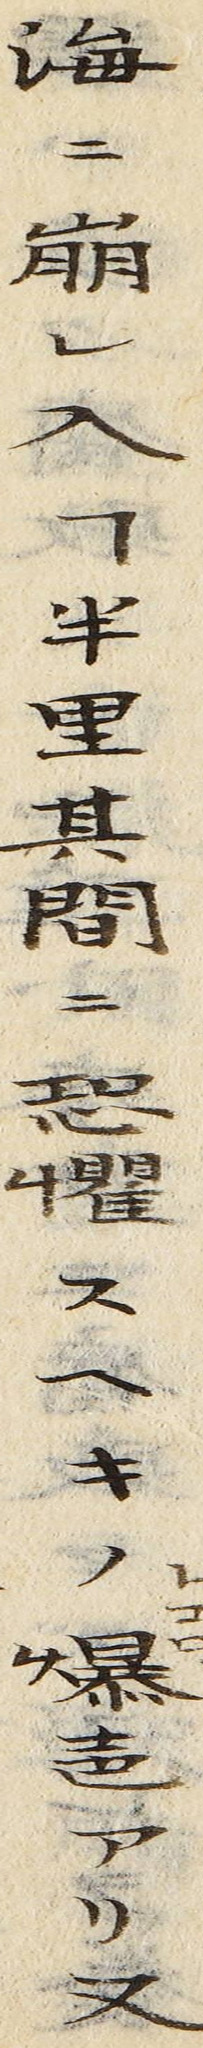海ニ崩レ入コト半里其間ニ恐懼スヘキノ爆声アリ又
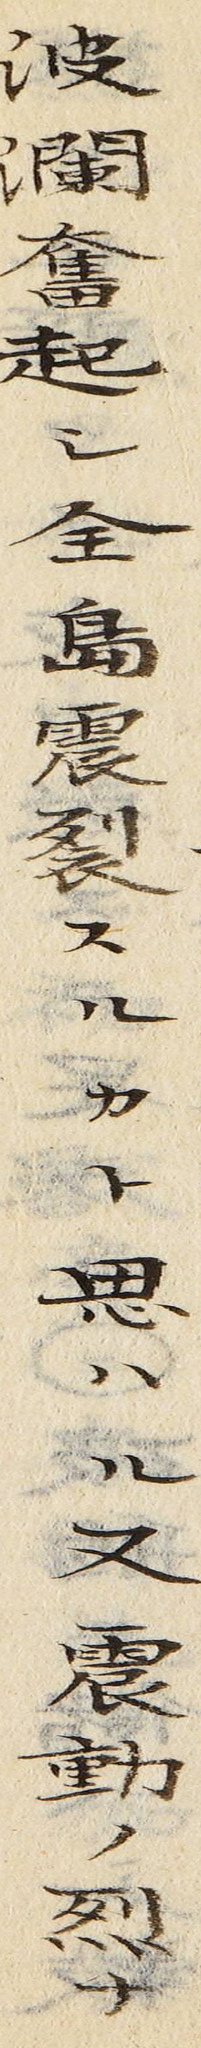波瀾奮起シ全島震裂スルカト思ハル又震動ノ烈ナ
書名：漂流紀事
